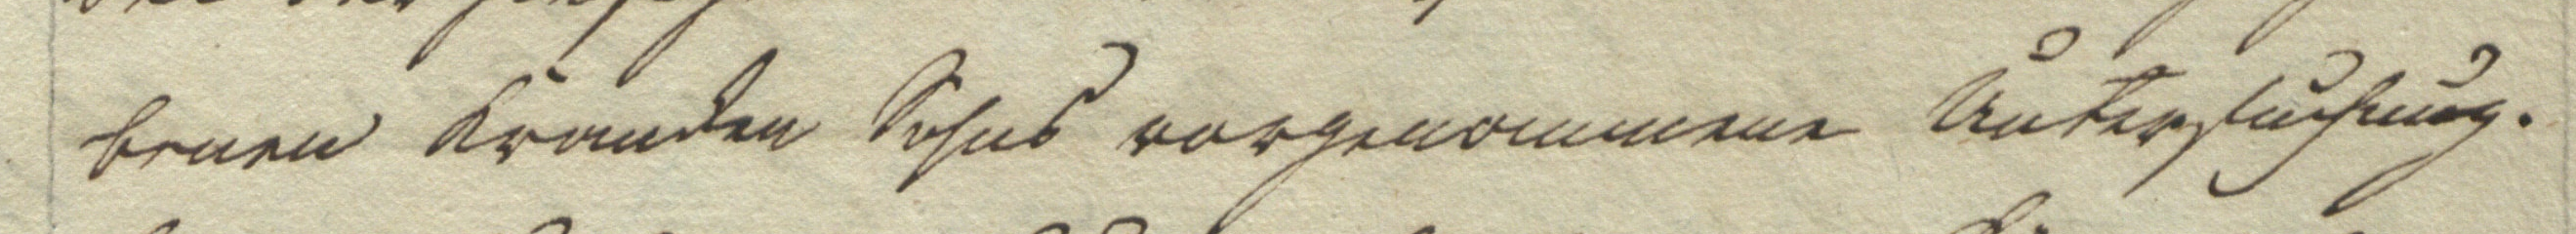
benen kranken Sohns vorgenommene Untersuchung.
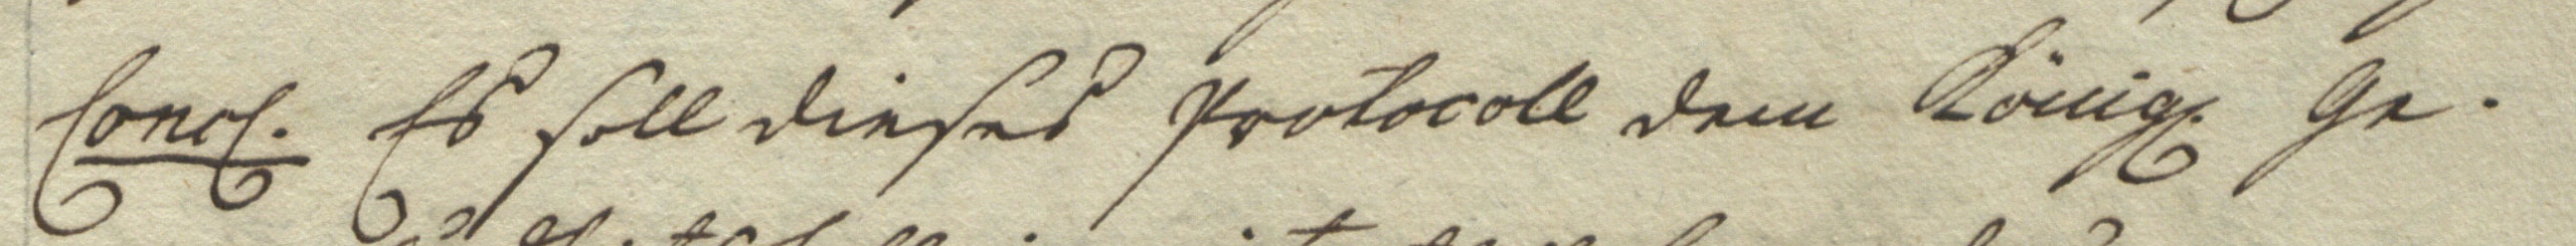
Concl. Es soll dieses Protocoll dem Königl. Ge¬
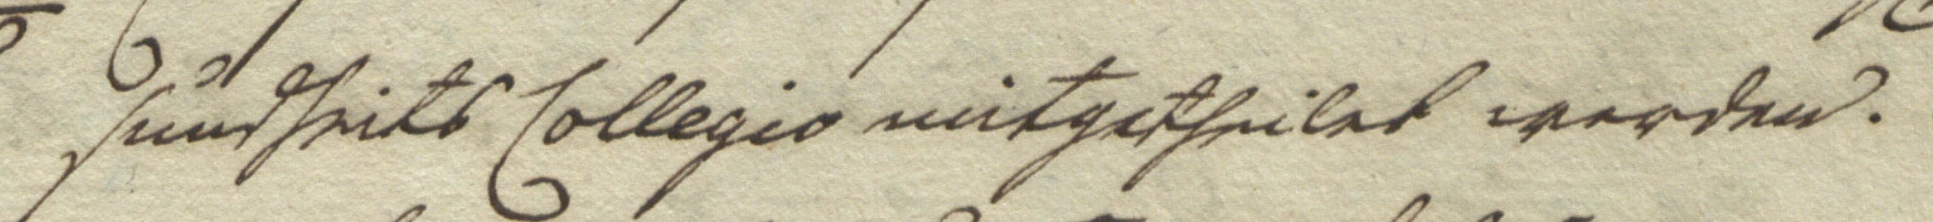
sundheits Collegio mitgetheilet werden.
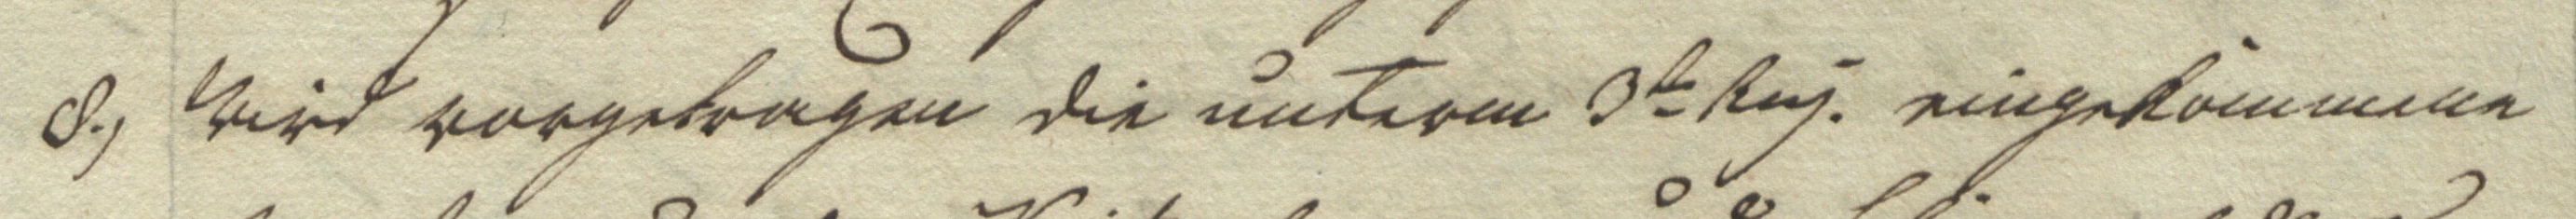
8., Wird vorgetragen die unterm 3ten huj. eingekommene
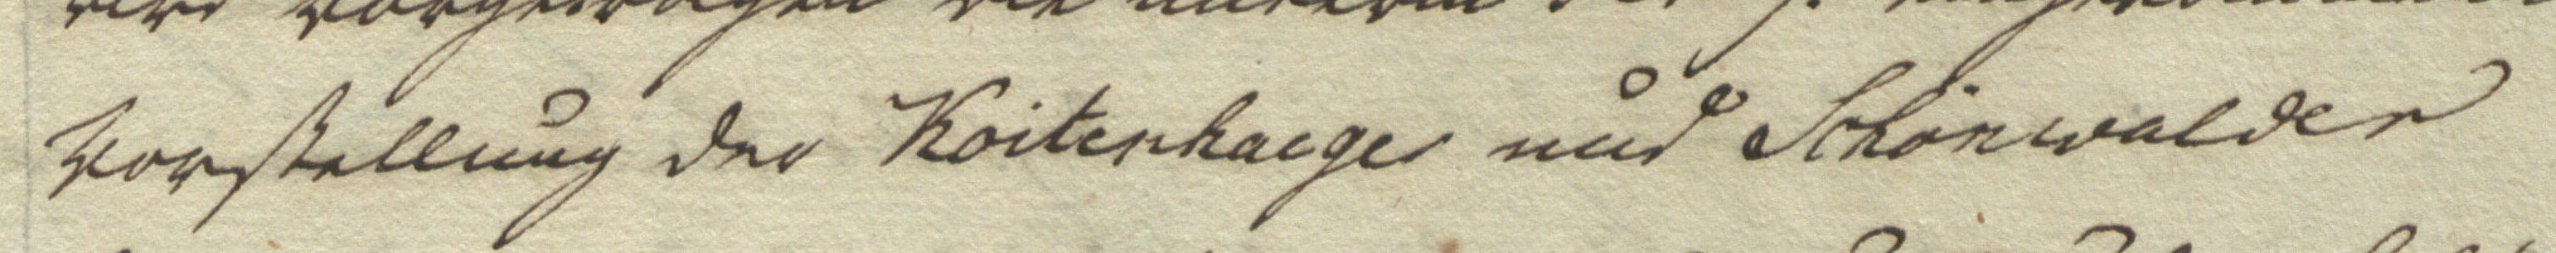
Vorstellung der Koitenhaeger und Schönwalder
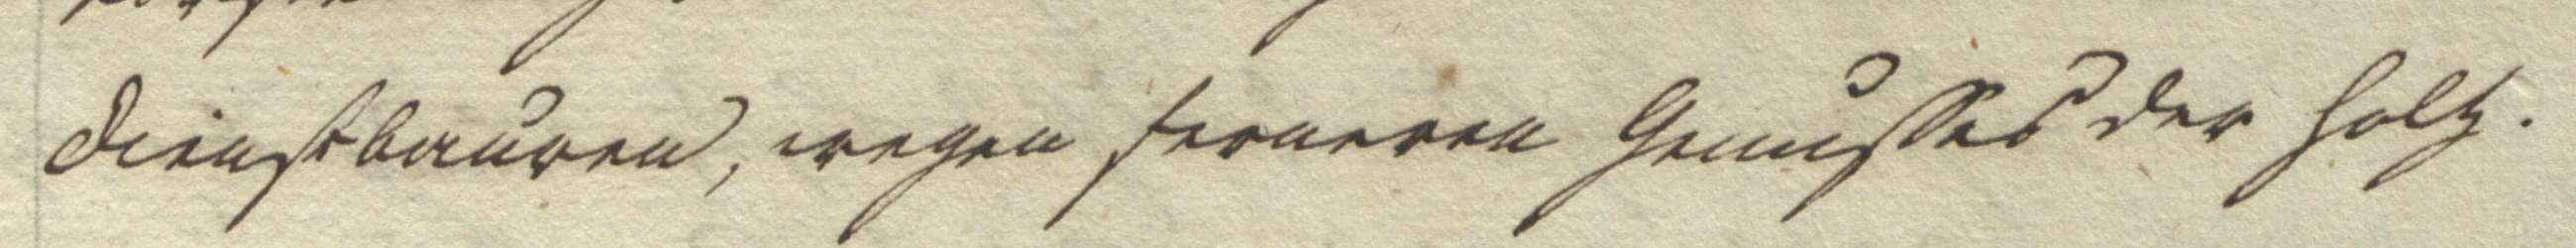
Dienstbauren, wegen ferneren Genusses der Holz¬
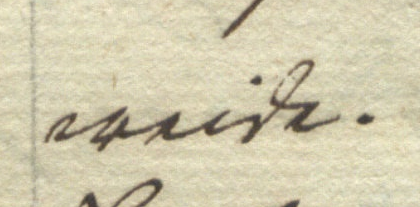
weide.
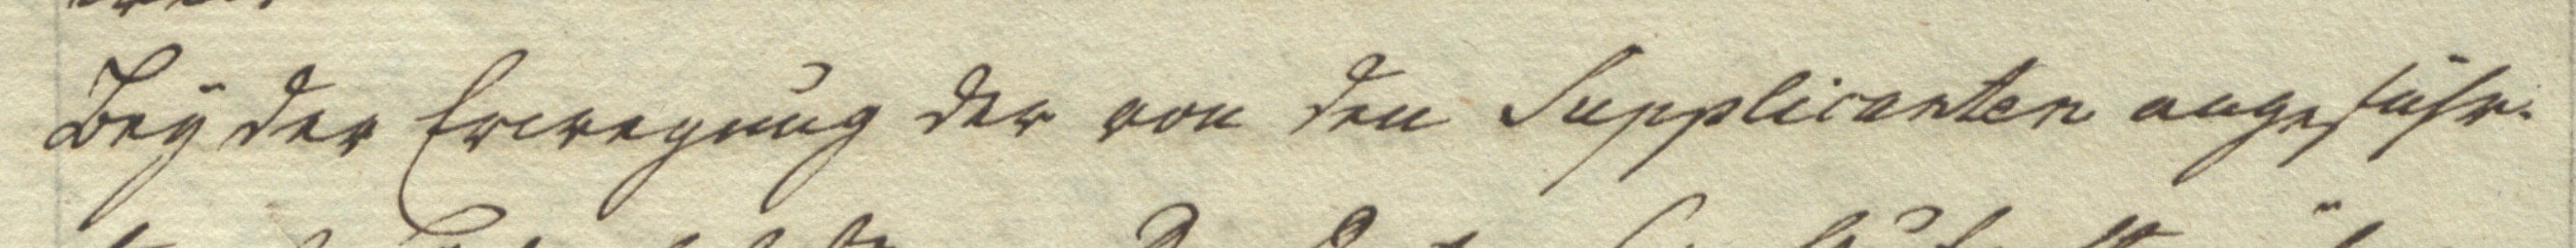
Bey der Erwegung der von den Supplicanten angeführ¬
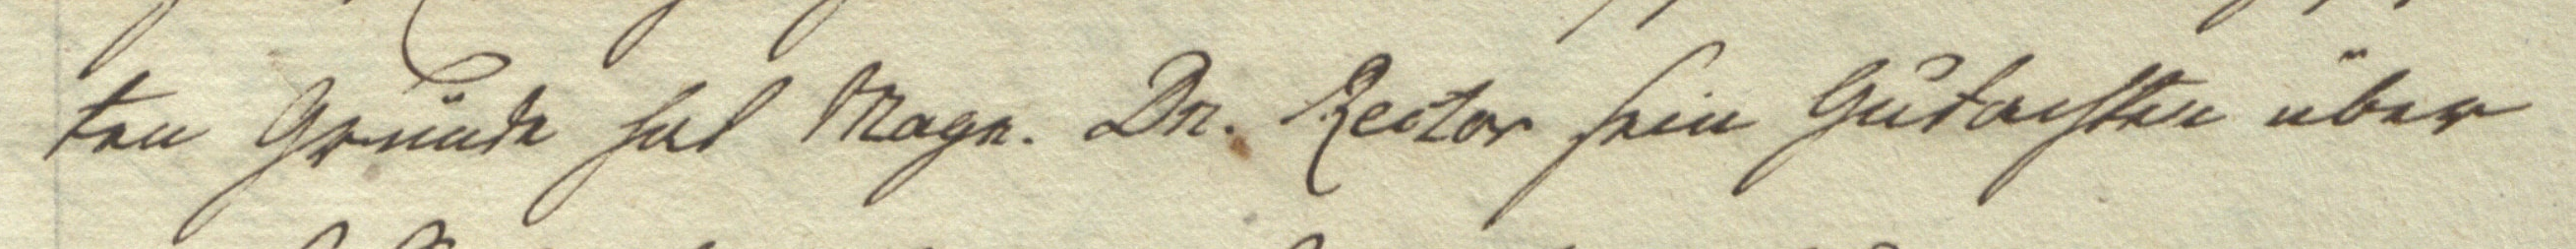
ten Gründe hat Magn. Dn. Recotr sein Gutachten über
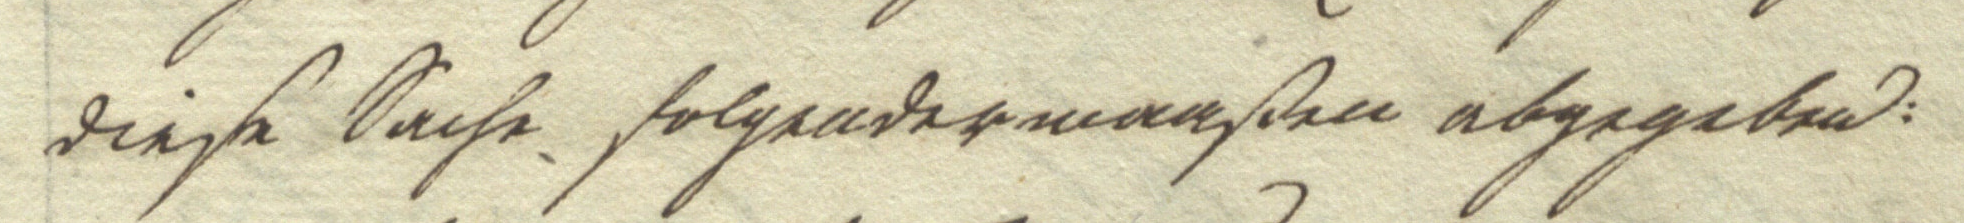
diese Sache folgendermaaßen abgegeben:
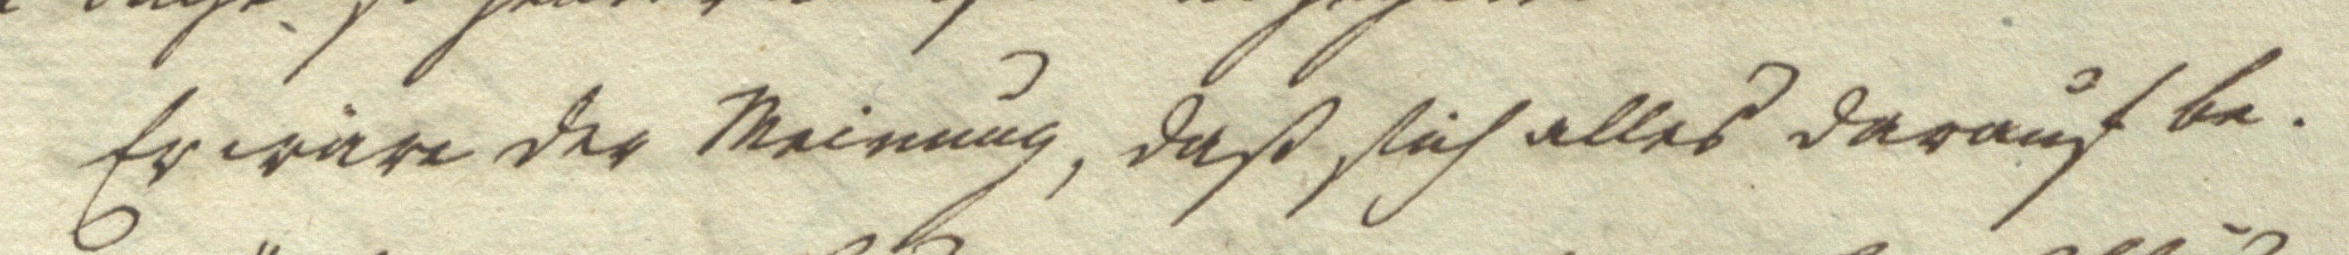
Er wäre der Meinung, daß sich alles darauf be¬
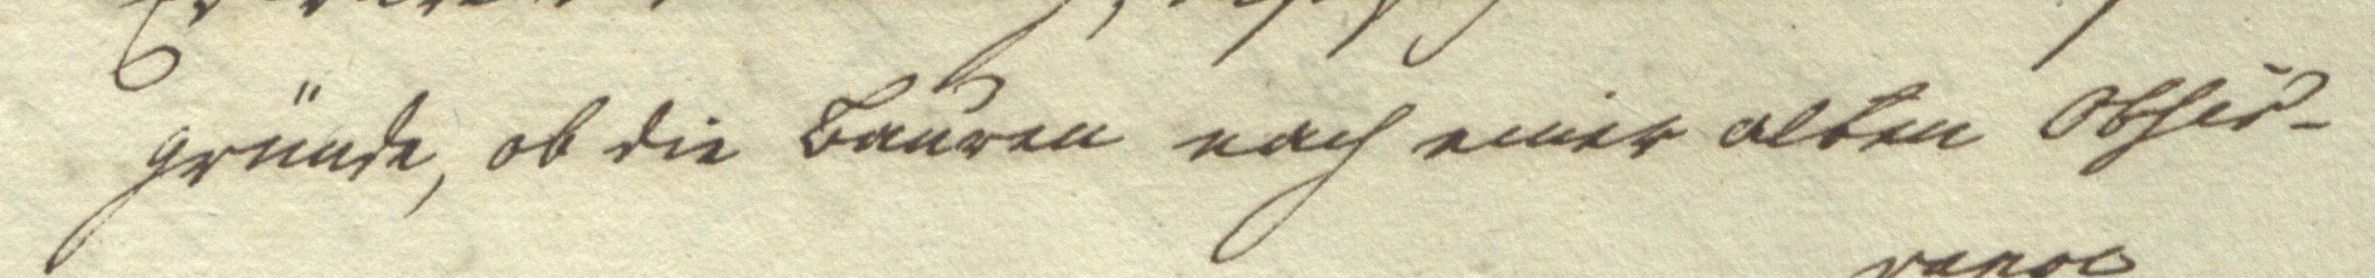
gründe, ob die Bauren nach einer alten Obser¬
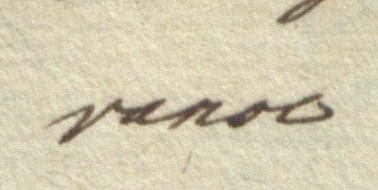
vance
